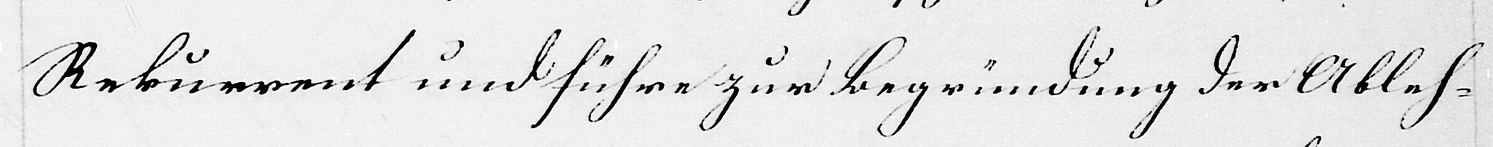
Rekurrent und führe zur Begründung der Ableh¬
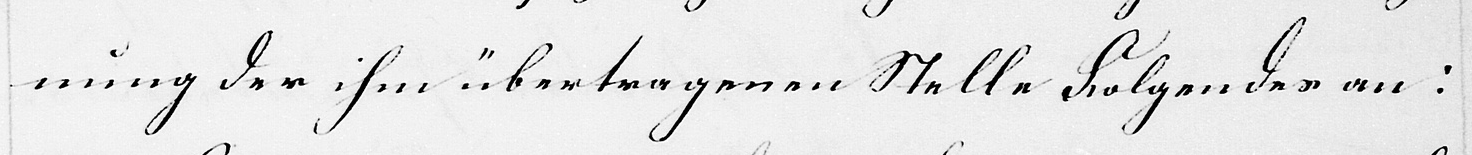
nung der ihm übertragenen Stelle Folgendes an:
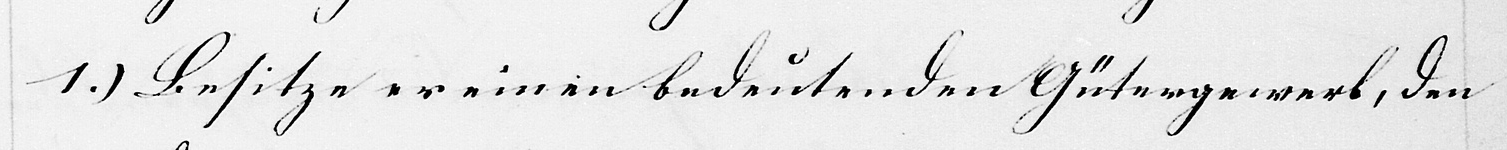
1.) Besitze er einen bedeutenden Gütergewerb, den
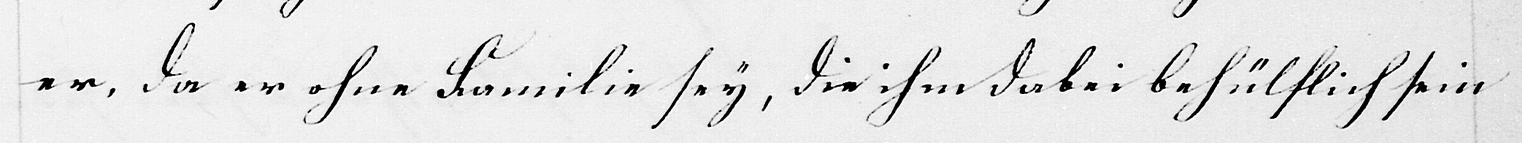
er, da er ohne Familie sey, die ihm dabei behülflich sein
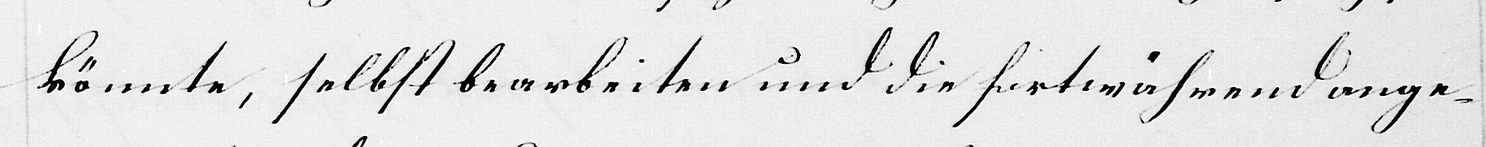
könnte, selbst bearbeiten und die fortwährend ange¬
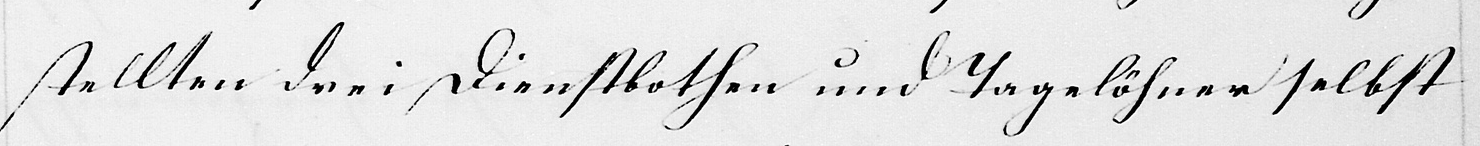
stellten drei Dienstbothen und Tagelöhner selbst
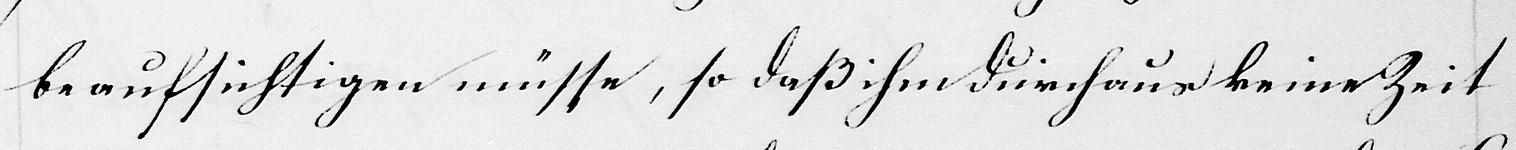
beaufsichtigen müsse, so daß ihm durchaus keine Zeit
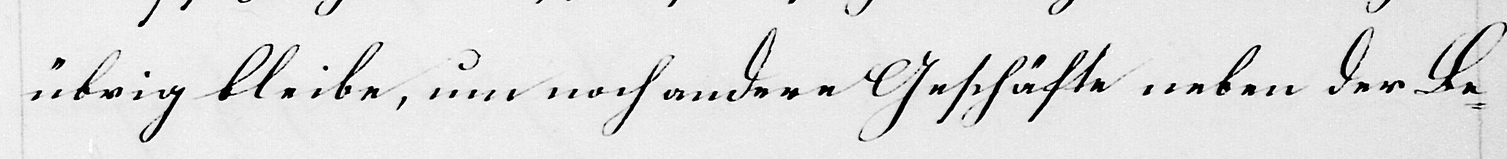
übrig bleibe, um noch andere Geschäfte neben der Be¬
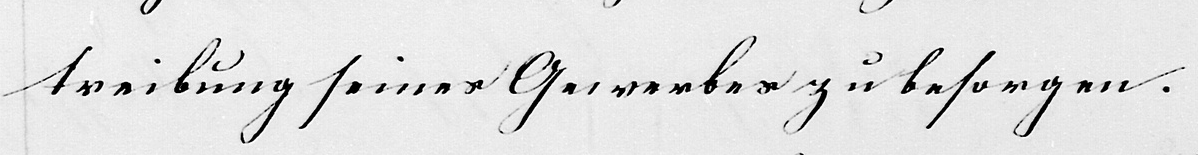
treibung seines Gewerbes zu besorgen.
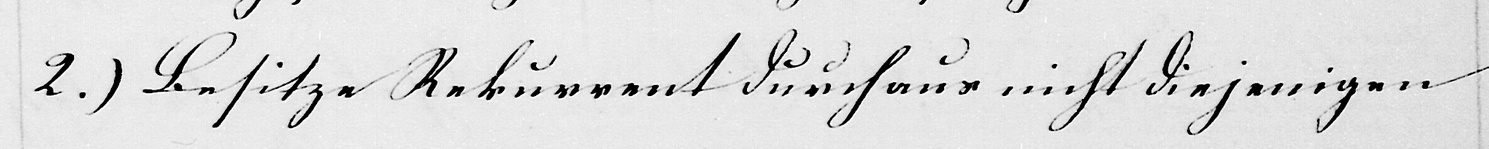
2.) Besitze Rekurrent durchaus nicht diejenigen
